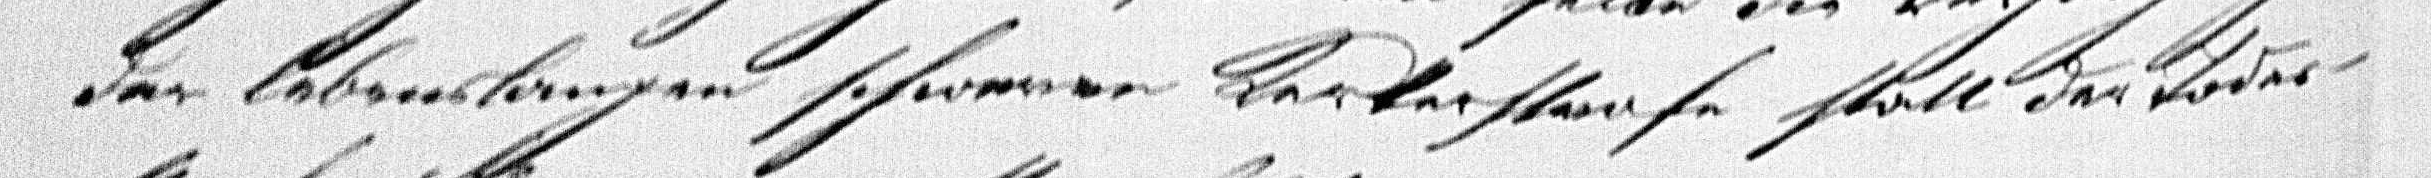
der lebenslangen schweren Kerkerstrafe statt der Todes¬
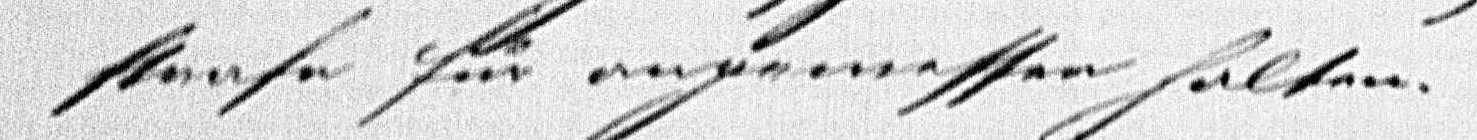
strafe für angemessen halten.
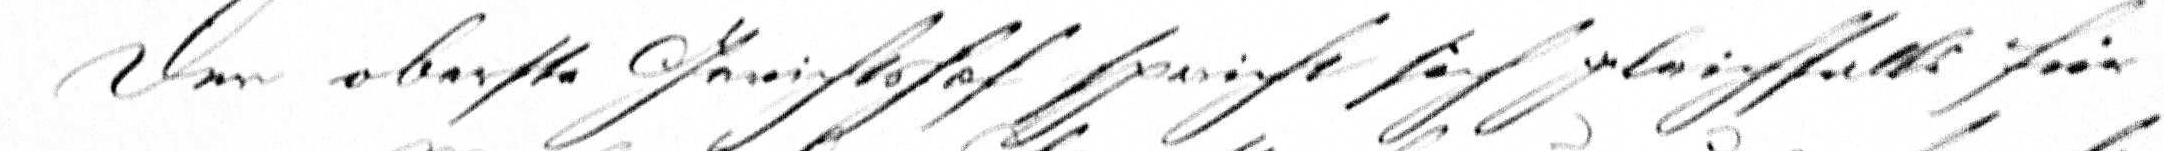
Der oberste Gerichtshof spricht sich gleichfalls für
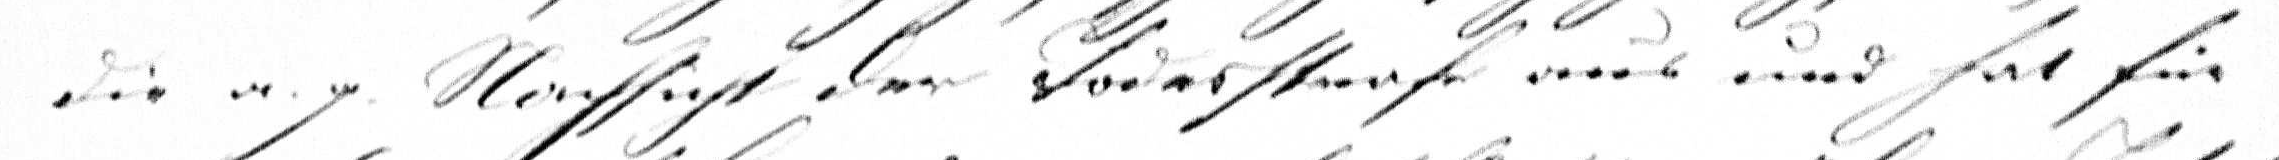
die a.g. Nachsicht der Todesstrafe aus und hat für
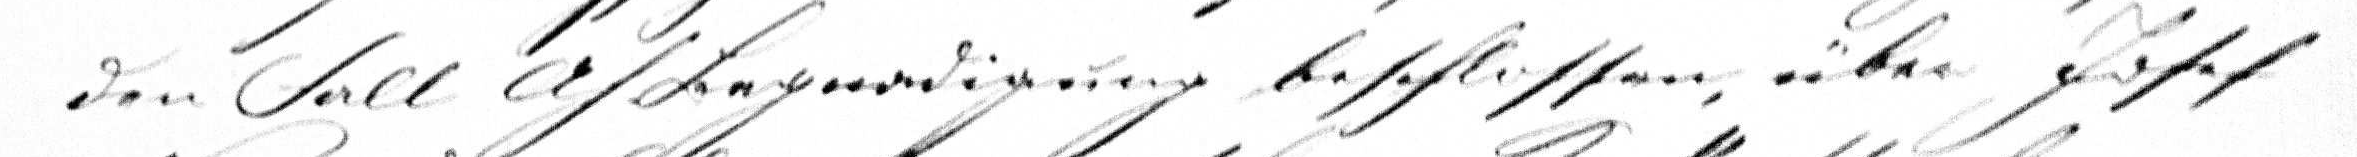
den Fall Ah Begnadigung beschlossen, über Josef
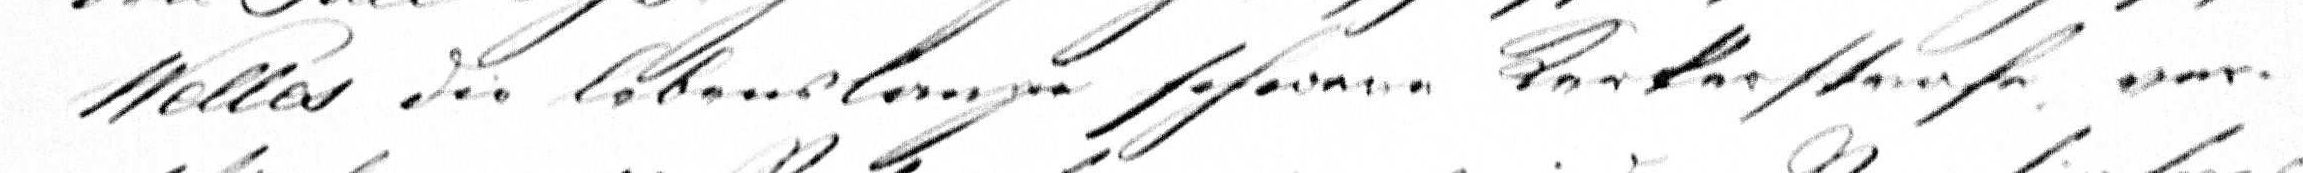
Welles die lebenslangen schweren Kerkerstrafe, ver¬
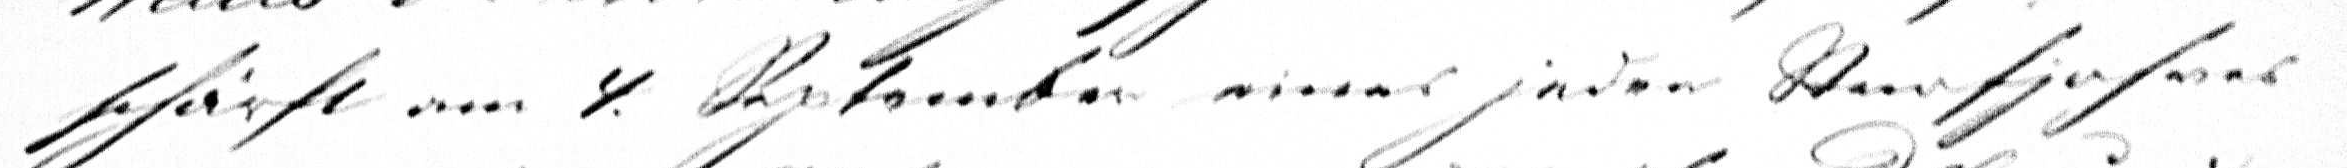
schärft am 4. September eines jeden Strafjahres
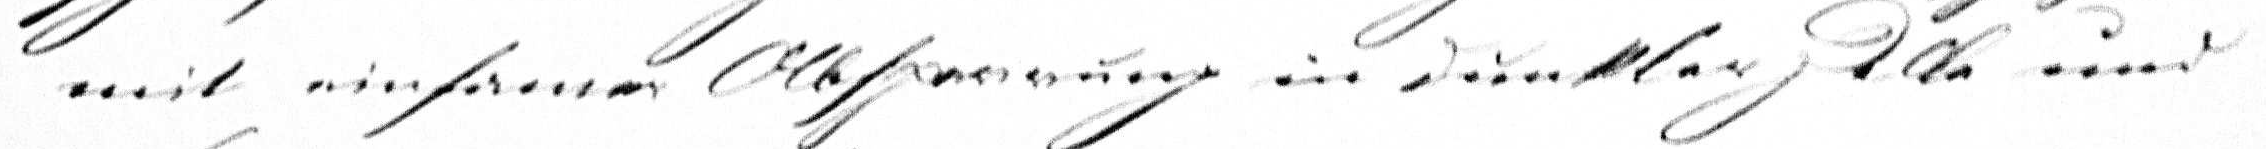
mit einsamer Absperrung in dunkler Zelle und
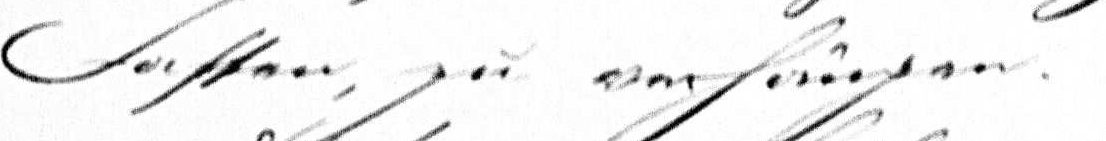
Fasten zu verhängen.
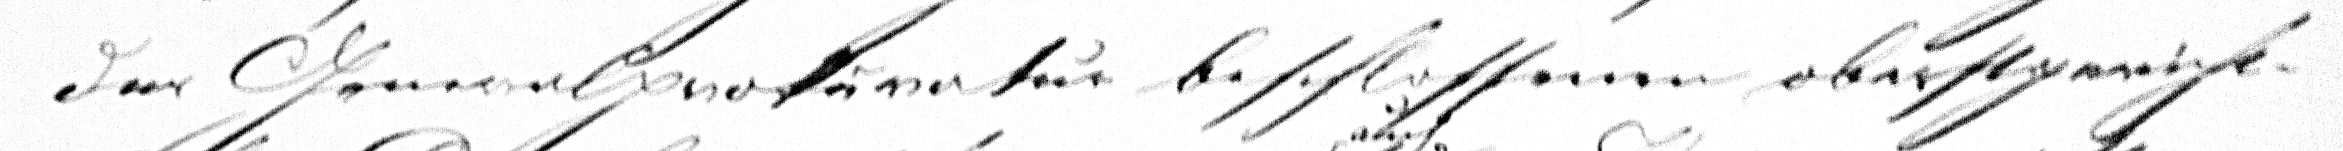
der Generalprokuratur beschlossenen oberstgericht¬
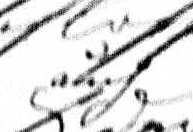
sich
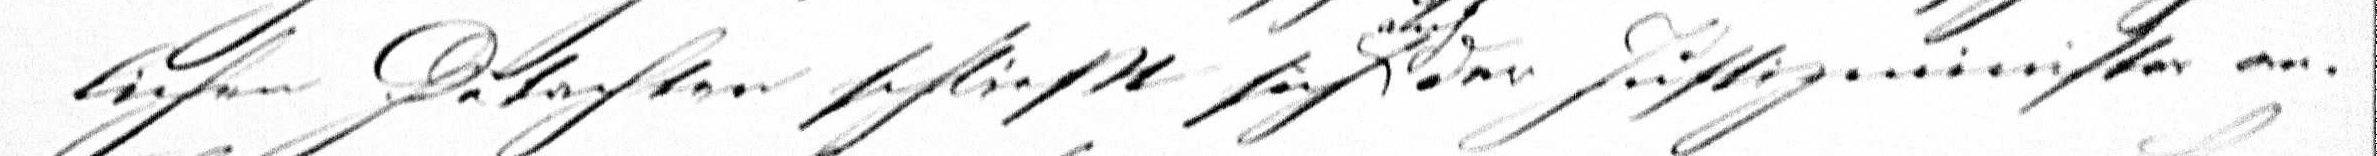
lichen Gutachten schließt auch der Justizminister an.
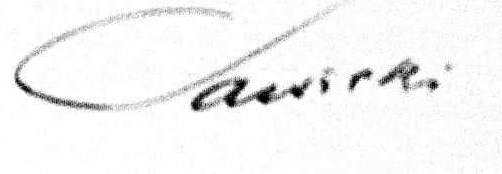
Sawicki
